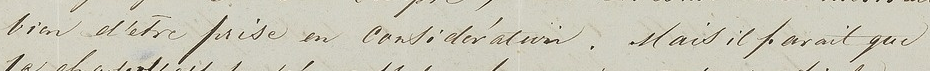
bien d'être prise en considération. Mais il paraît que
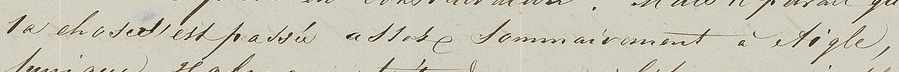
la chose est passée assez sommairement à Aigle, –
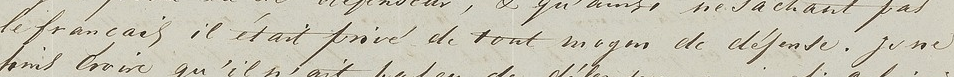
le français il était privé de tout moyen de défense. Je ne
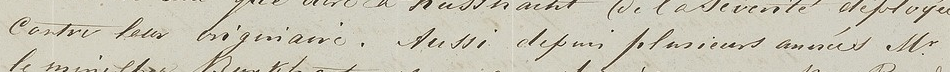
contre leur originaire. Aussi depuis plusieurs années Mr
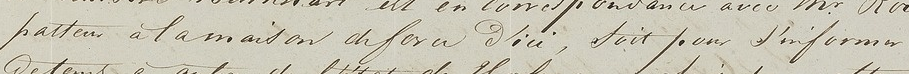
pasteur à la maison de force d'ici, soit pour s'informer
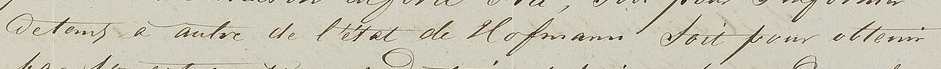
de tems à autre de l'état de Hofmann soit pour obtenir
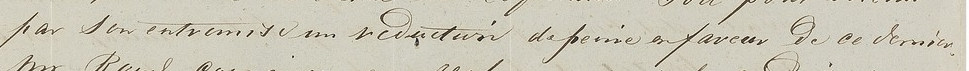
par son entremise une réduction de peine en faveur de ce dernier.
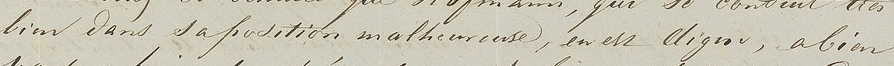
bien dans sa position malheureuse, en est digne, a bien
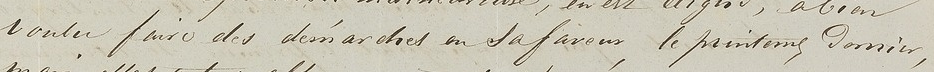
voulu faire des démarches en sa faveur le printems dernier,
